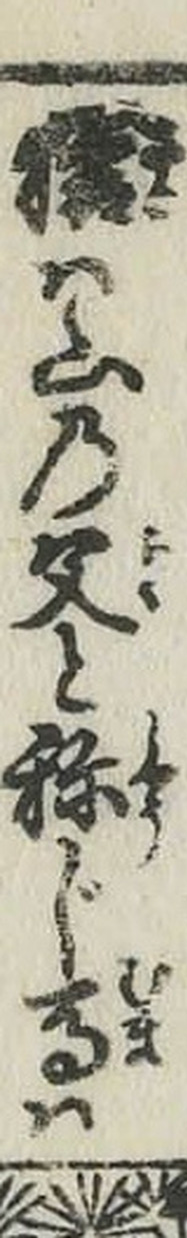猿は山の父と称じ馬は
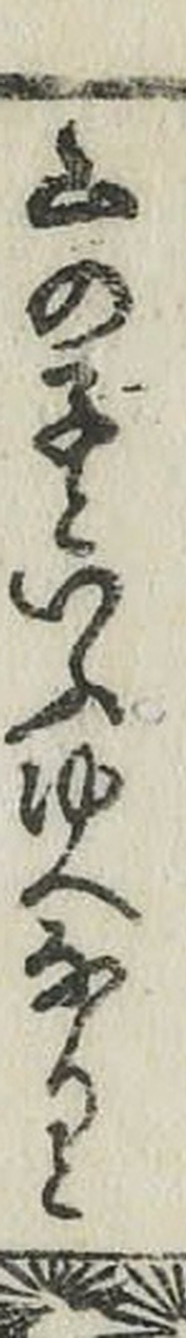山の子といふゆへなりと
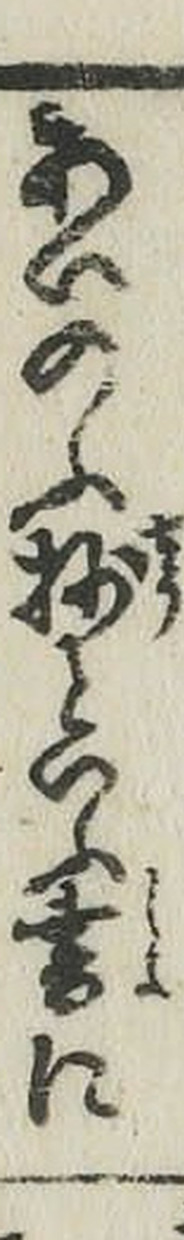あいのふ抄といふ書に
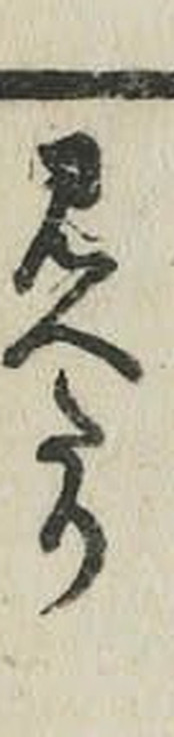見へたり

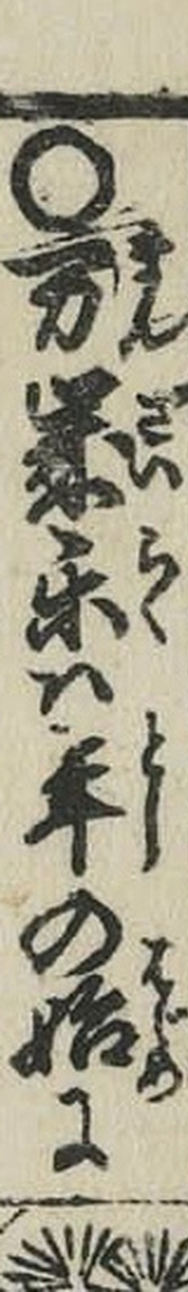○万歳楽は年の始に
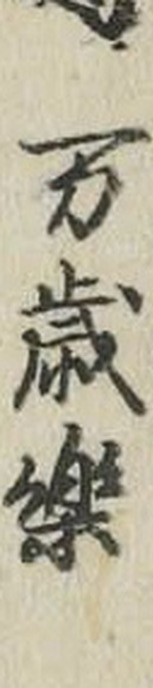万歳楽
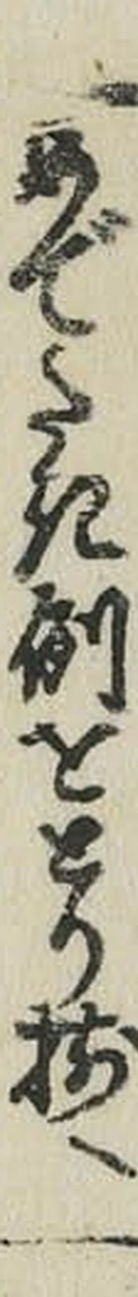めでたき例をとり揃へ
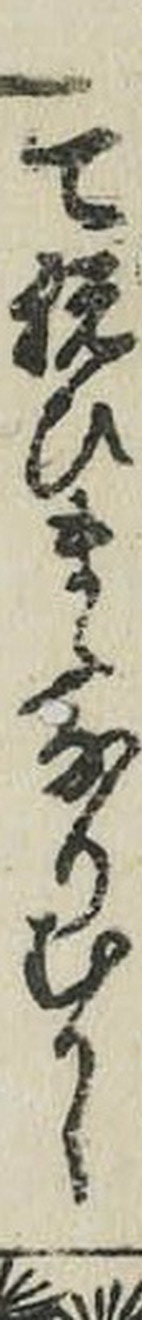て祝ひまふなりむかし
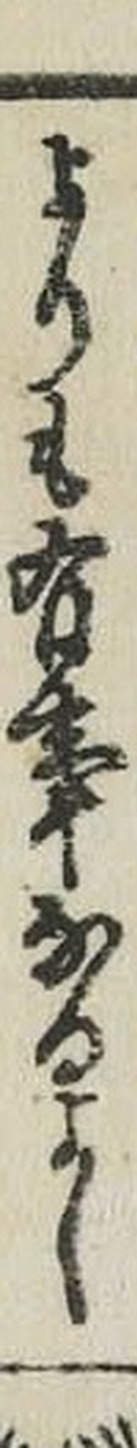よりも有事なるよし
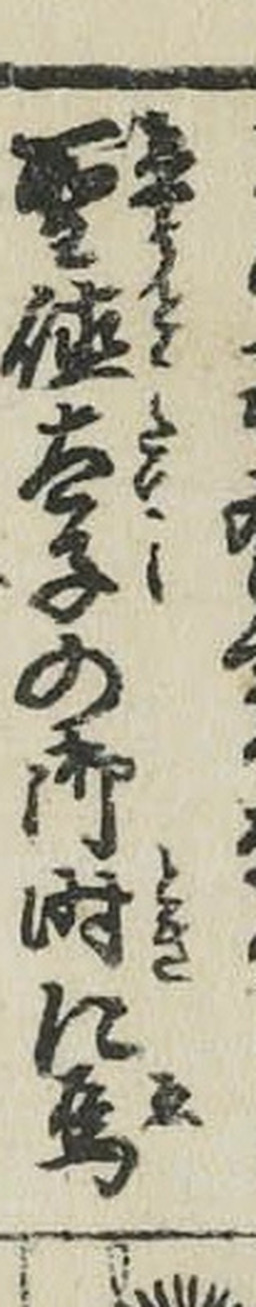聖徳太子の御時に烏
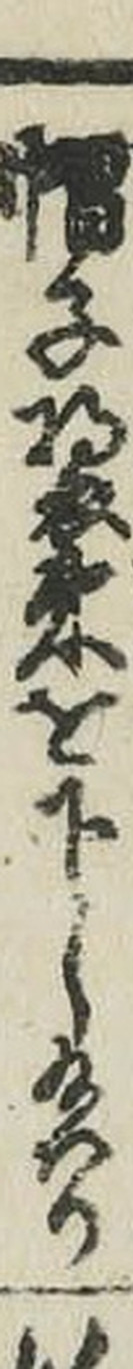帽子装束を下し給はり
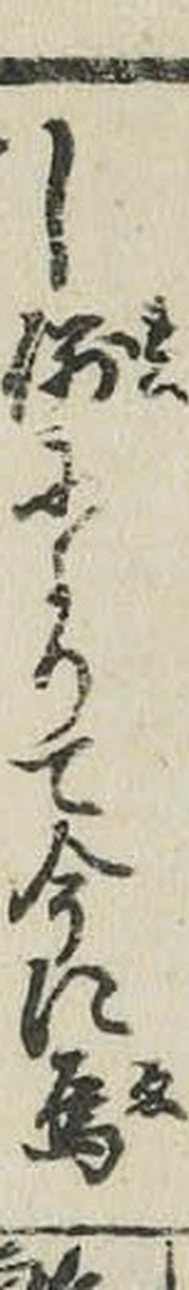し例によりて今に烏
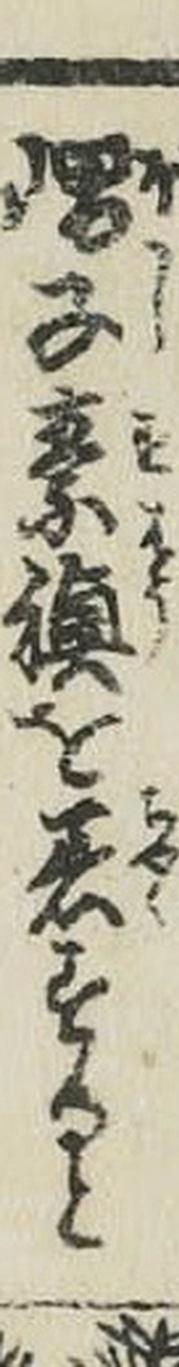帽子素襖を着すると
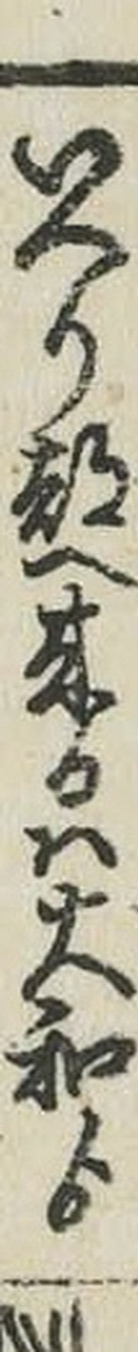いへり都へ来るは大和より
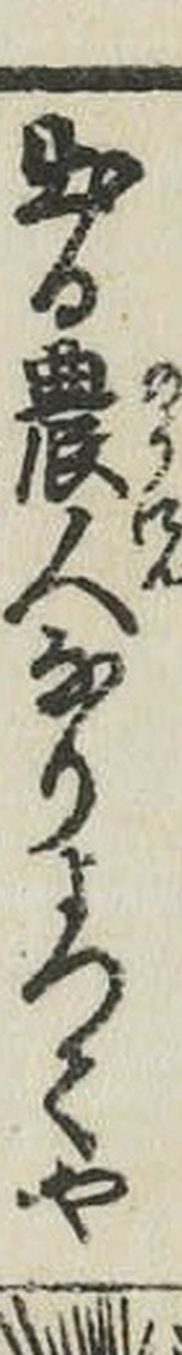出る農人なりよつてや
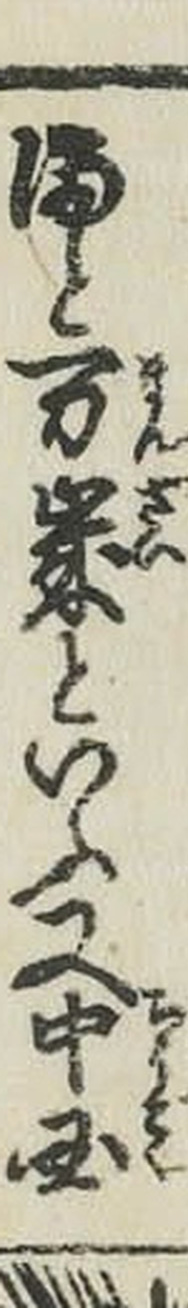まと万歳といふ又中国
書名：増補頭書訓蒙図彙大成 10巻 10:巻之21
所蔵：東京学芸大学教育コンテンツアーカイブ
